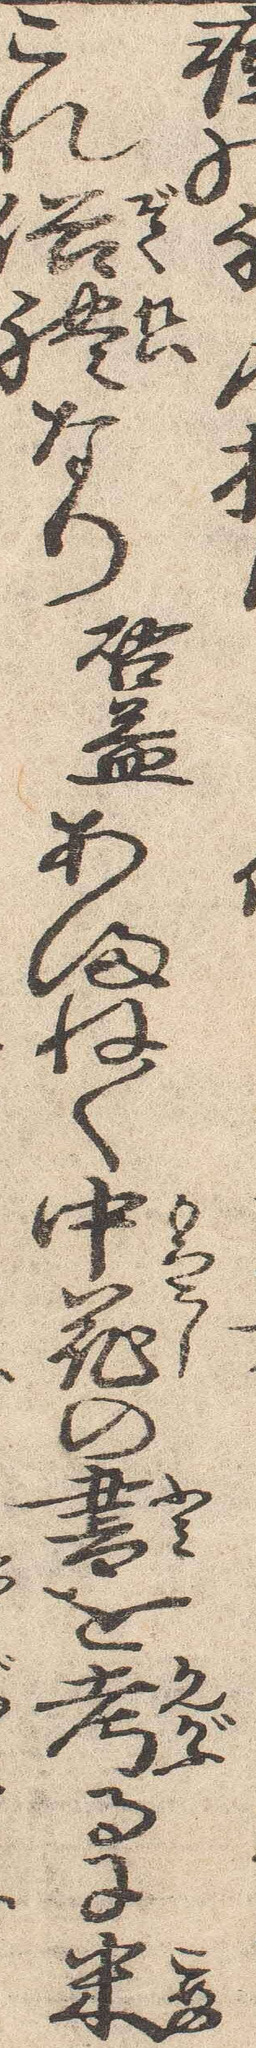これ俗礼なり啓益あまねく中花の書を考るに米
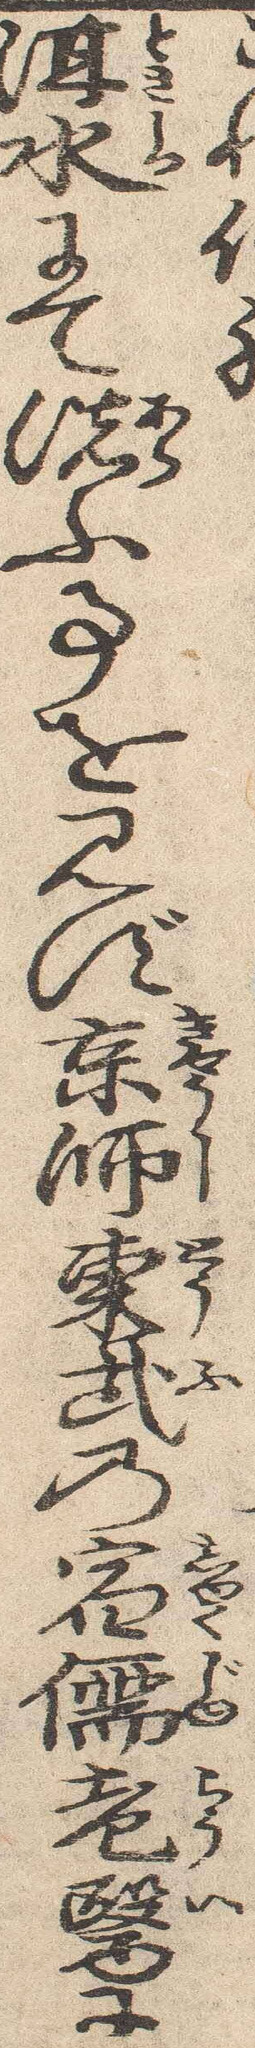泔水にて洗ふ事を見ず京師東武の宿儒老医に
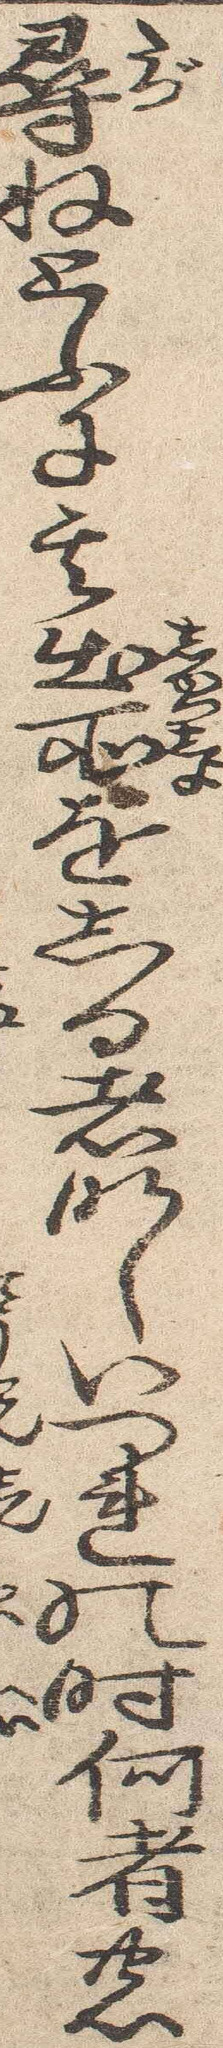尋ねとふに其出所をしる者なしいつれの時何者の
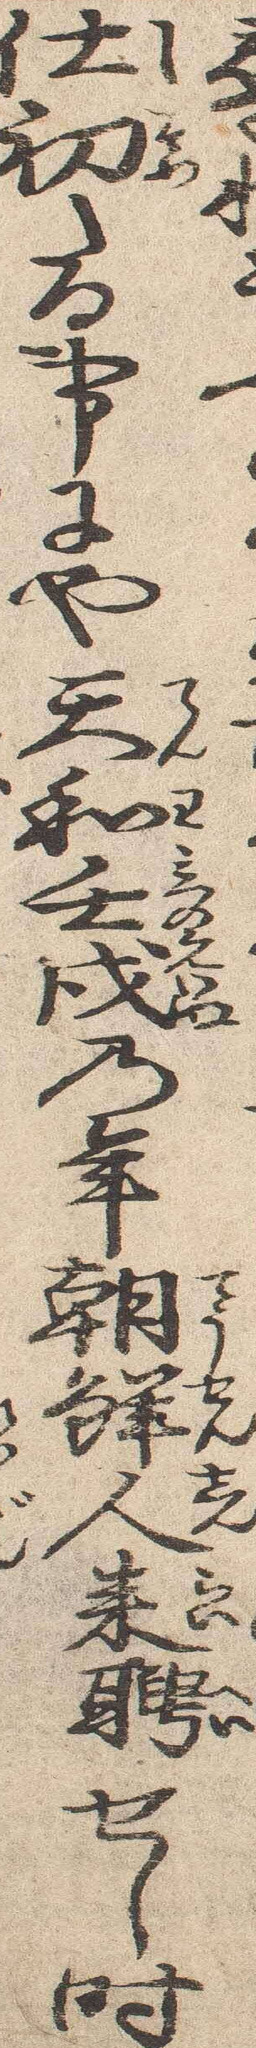仕初たる事にや天和壬戌の年朝鮮人来聘せし時
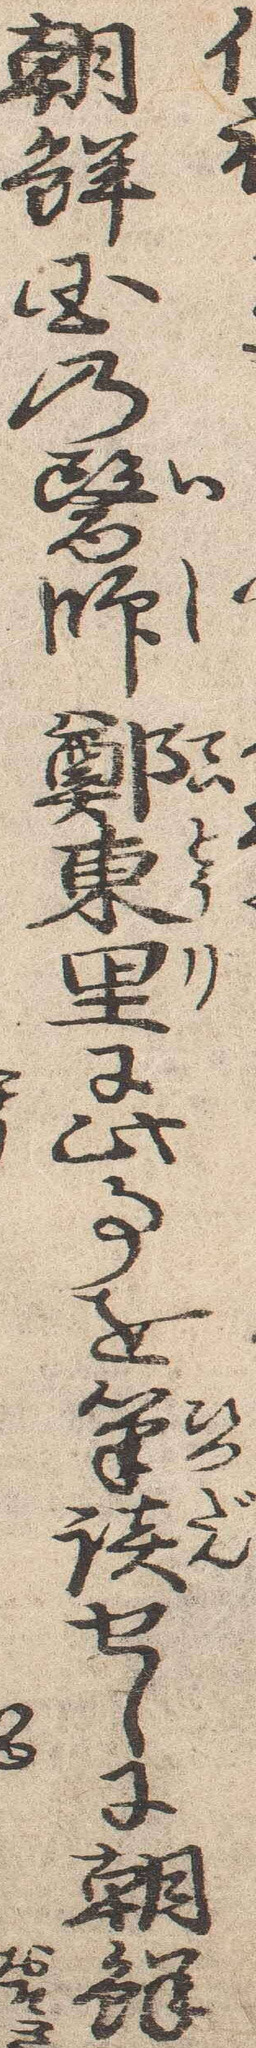朝鮮国の医師鄭東里に此事を筆談せしに朝鮮
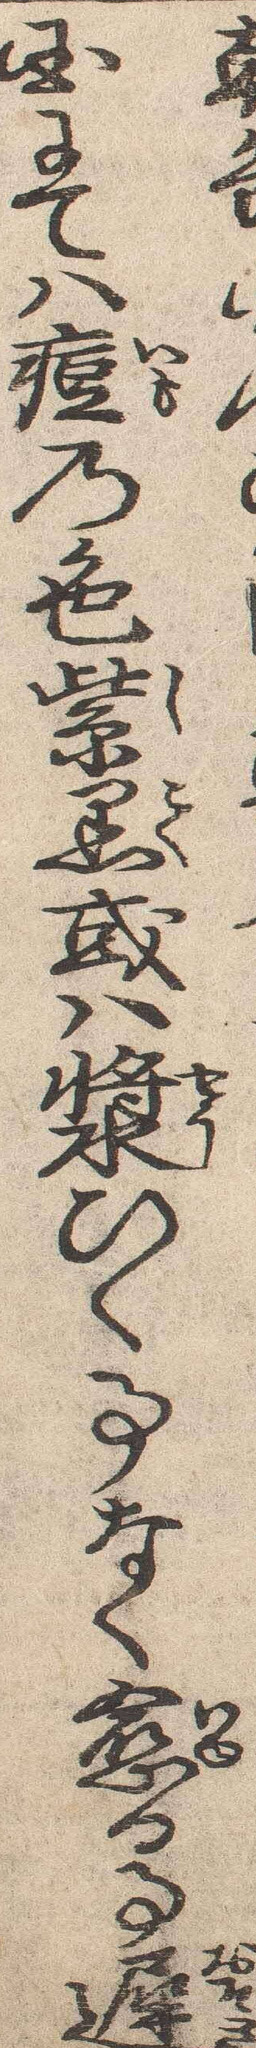国にては痘の色紫黒或は漿ひく事なく愈る事遅
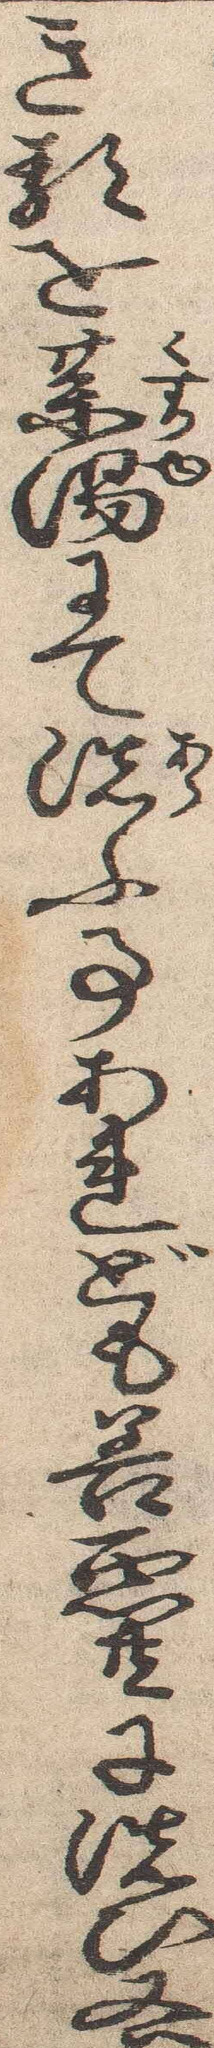き類を薬湯にて洗ふ事あれども善悪共に洗ひ又は

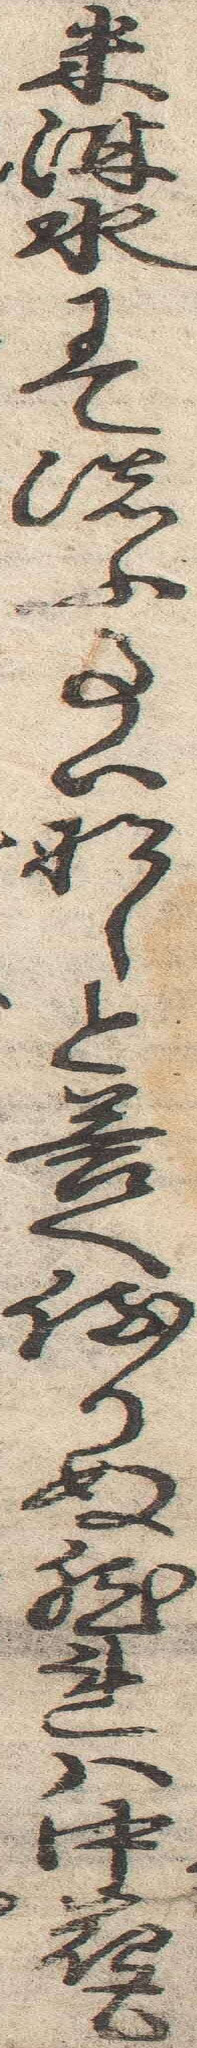米泔水にて洗ふ事はなしと答へ侍りぬ然れは中花も
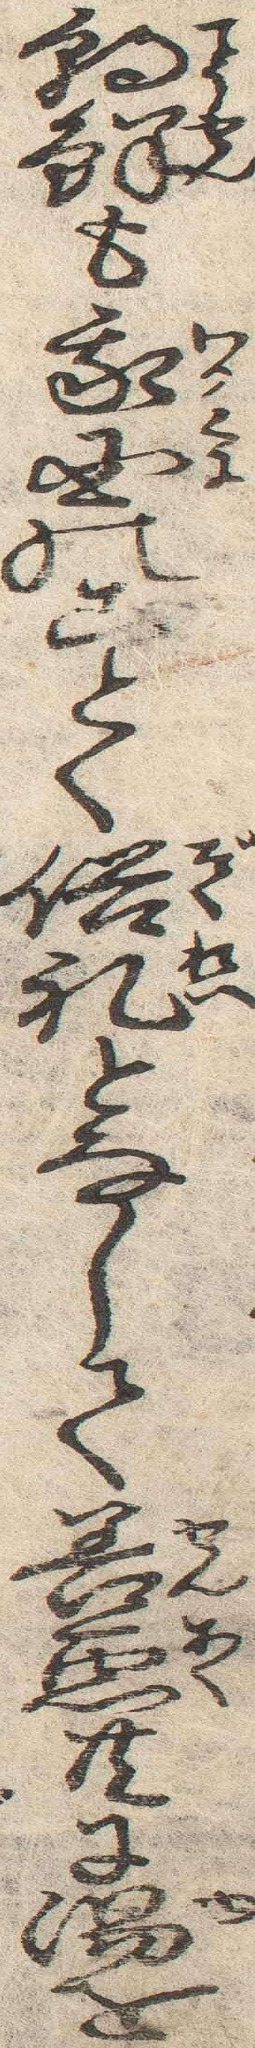朝鮮も我国のごとく俗礼となして善悪共に湯を
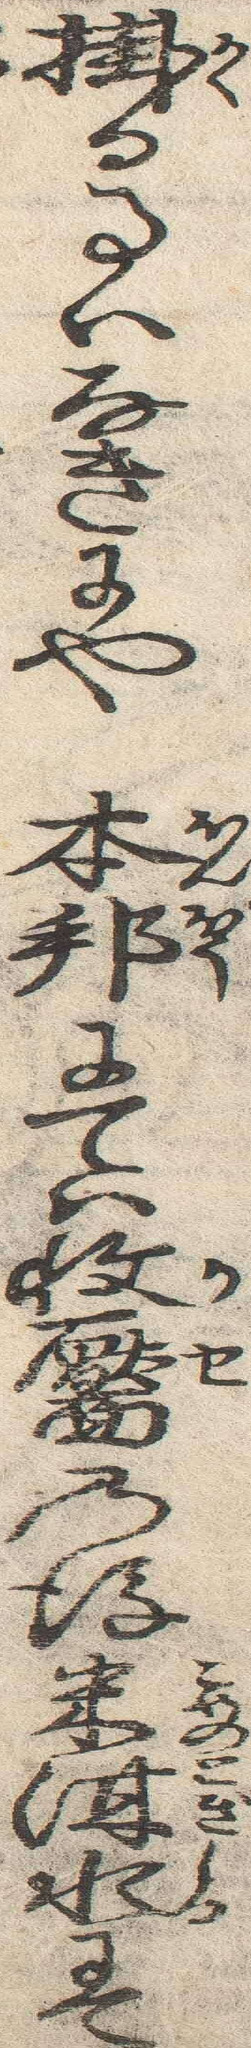掛る事はなきにや本邦にては収靨の後米泔水にて
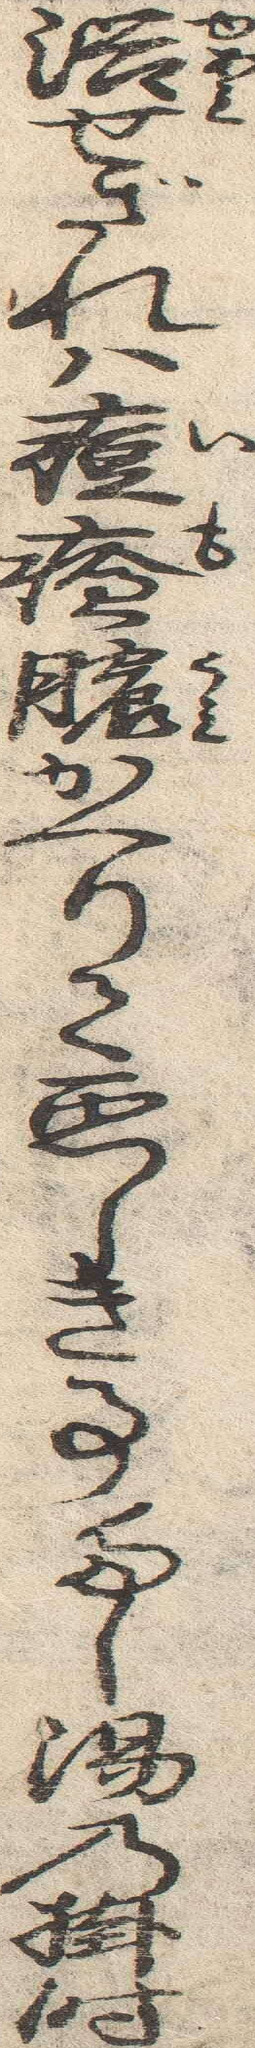浴せざれは痘瘡膿かへりて悪しき事多し湯の掛時
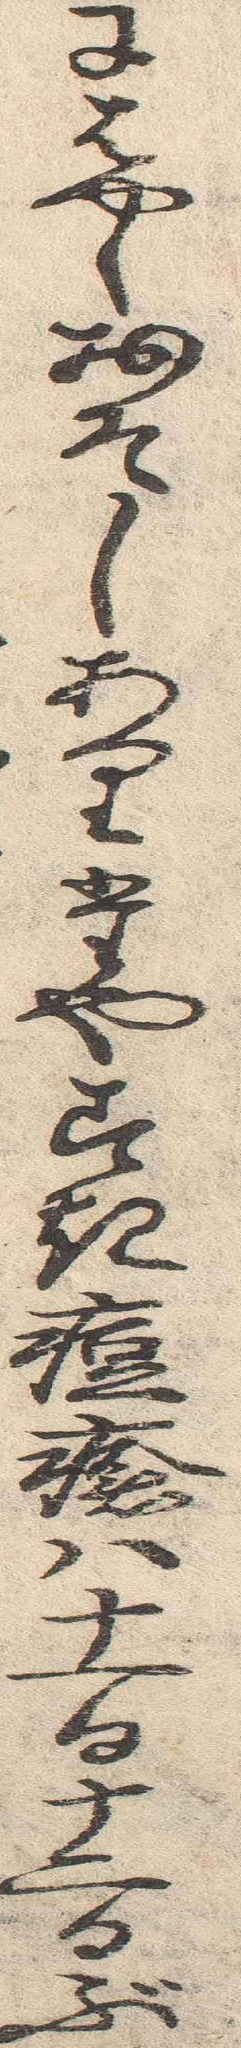にはやしおそしありたやすき痘瘡は十一日十二日ぶ
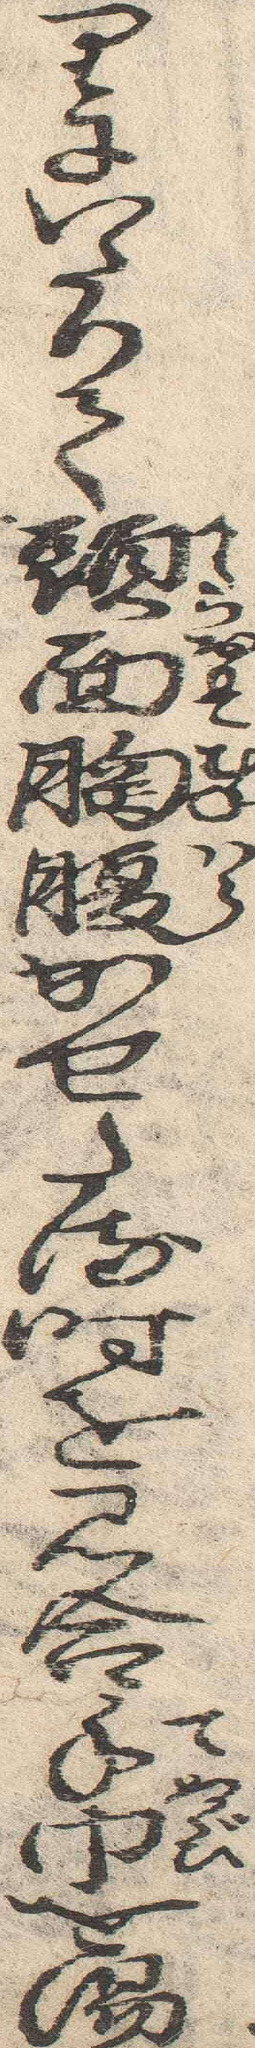りにいたりて頭面胸腹かせたる時を見合手巾を湯
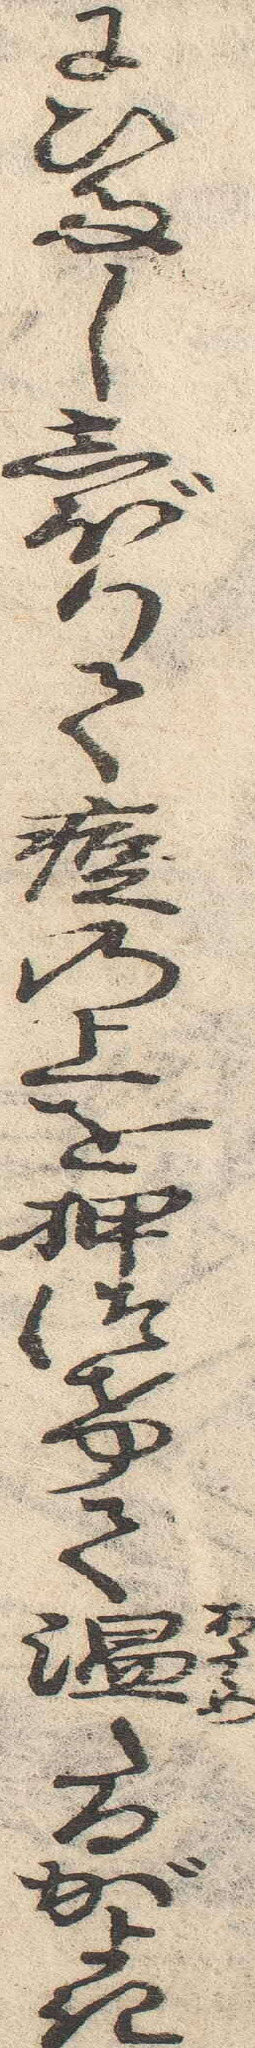にひたししぼりて痘の上を押つけて温たるがよき
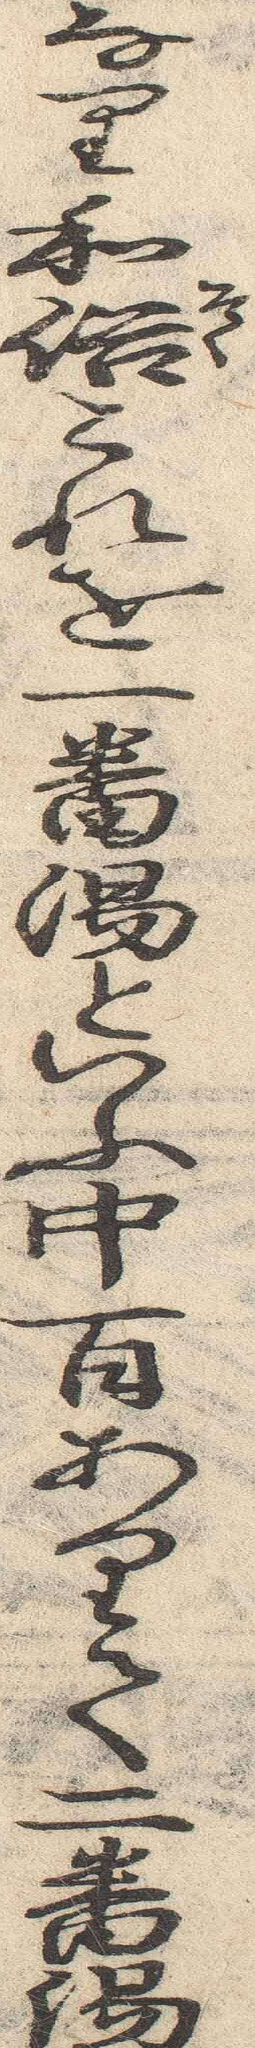なり和俗これを一番湯といふ中一日ありて二番湯
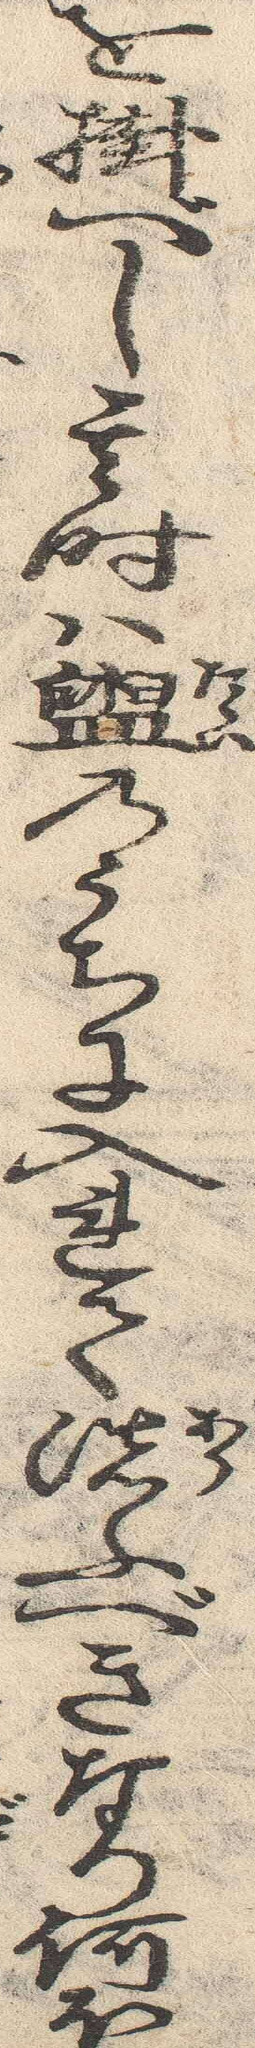を掛べし其時は盥のうちに入れて洗ふべきなり何ほ
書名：小児必用養育草
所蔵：東京学芸大学附属図書館 国文学研究資料館
